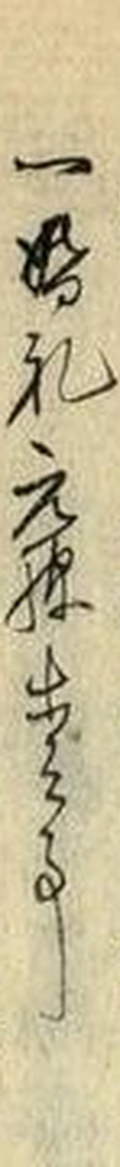一婚礼元服等之事
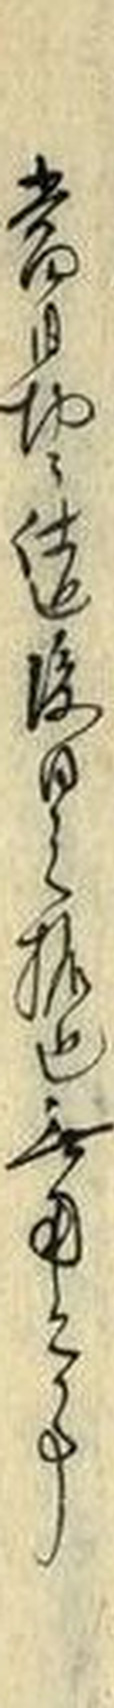当日切ニ仕廻後日之振廻無用之事
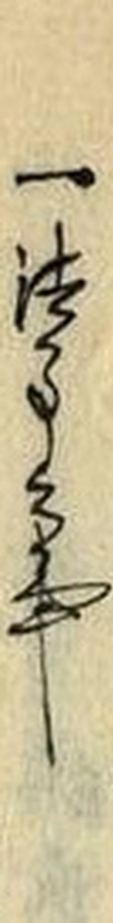一法事之事
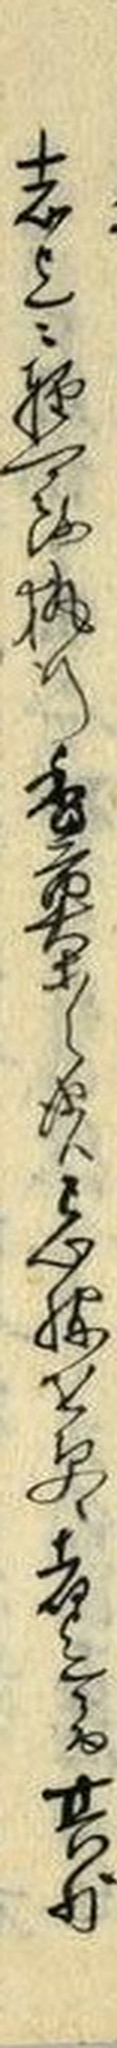志迄ニ軽可致執行香典等之儀ハ忌服を受候者迄ニ而其外
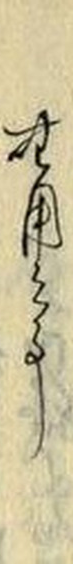一音物之事
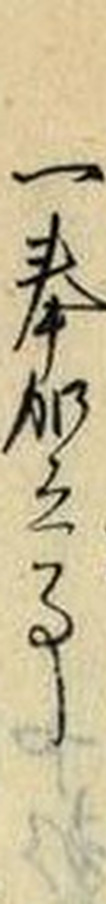一奉加之事
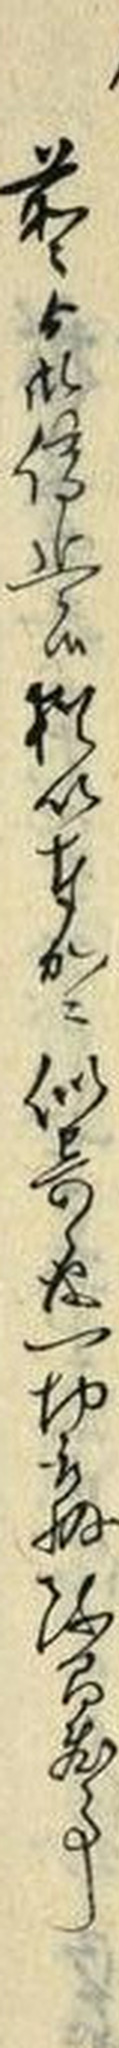前々ゟ御停止ニ候猶以奉加ニ似寄候儀一切取扱致間敷事
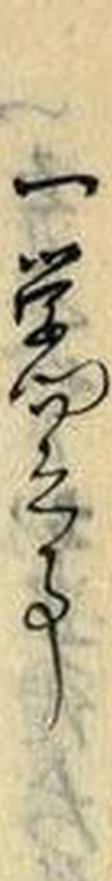一学問之事
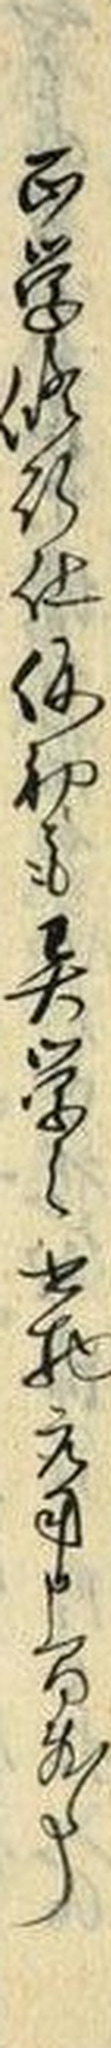正学修行仕仮初ニも異学之書物取用申間敷事
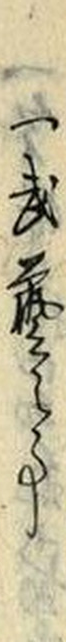一武芸之事
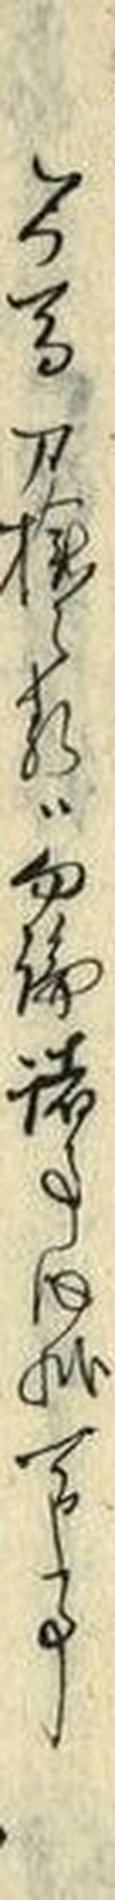弓馬刀鎗之類ハ勿論諸事心掛可申事
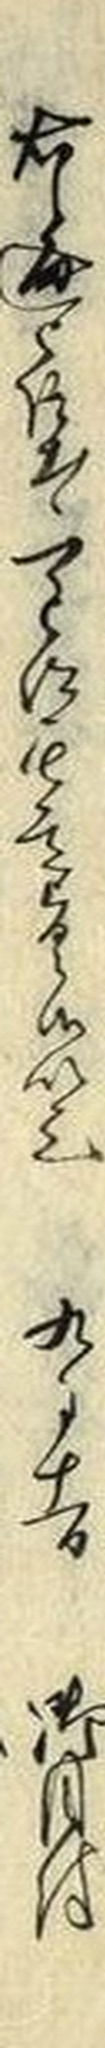右之通被仰出候可被得其意旨ニ候以上九月十一日御目付
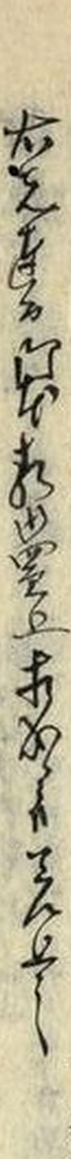右先達而御本類御買上相成候ニ付差上之
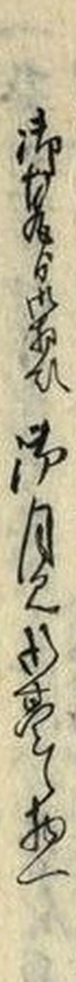御本丸ゟ御拝領御月見御台物一

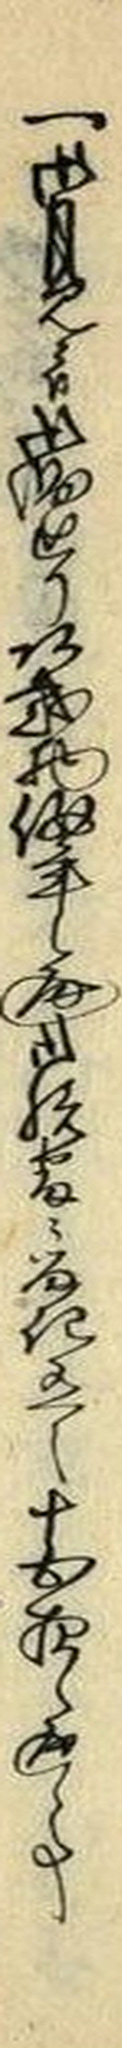一御月見ニ付御側廻り頂戴物例年之通御膳番ニ留記有之十五夜之通候事
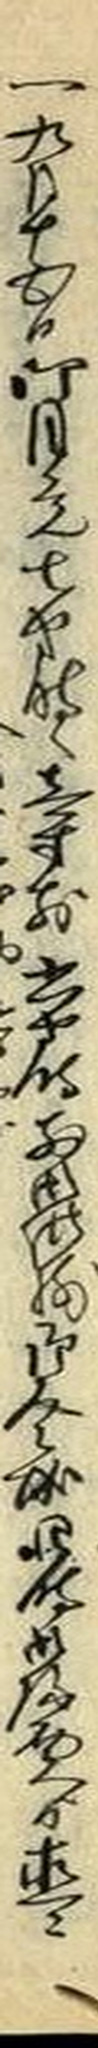一九月十五日御月見七半時へ壱寸前六半時前御供揃御登城四時御帰殿ゟ直ニ
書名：少傅日録抄（斉承付側向頭取日記、在府）
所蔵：福井県文書館 Fukui Prefectural Archives
